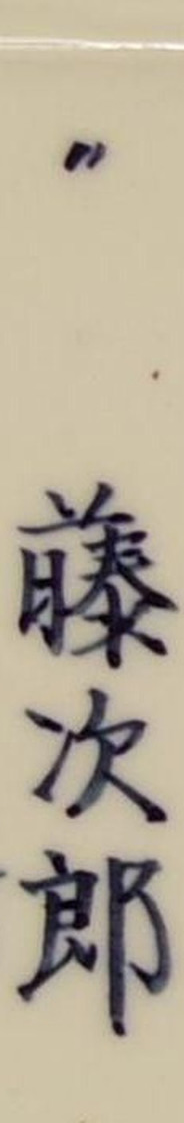藤次郎
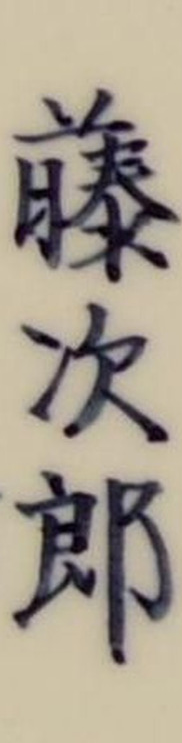藤次郎
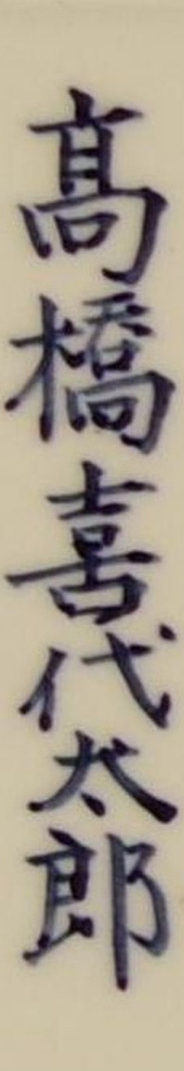高橋喜代太郎
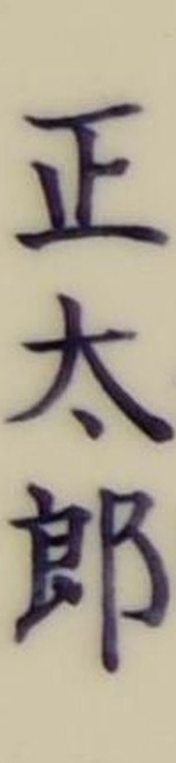正太郎

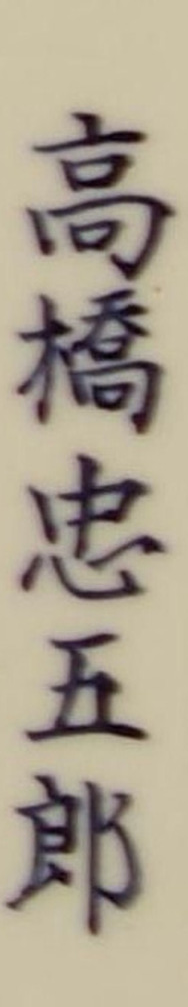高橋忠五郎
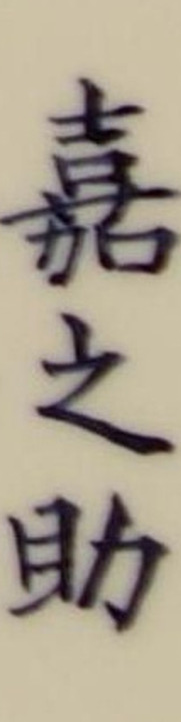嘉之助
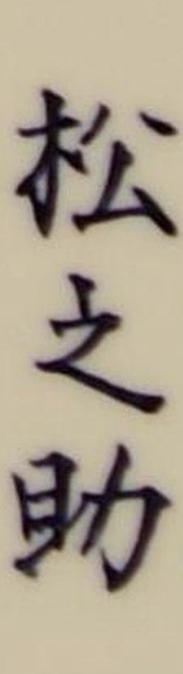松之助
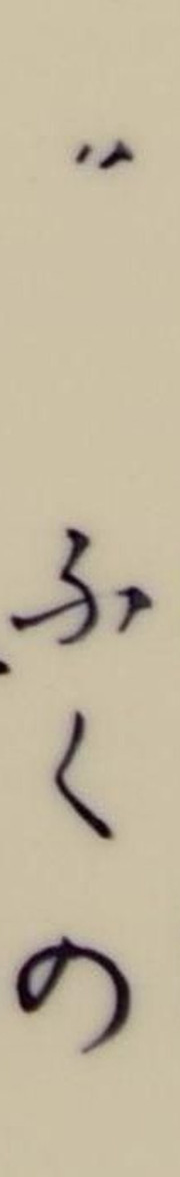ふくの
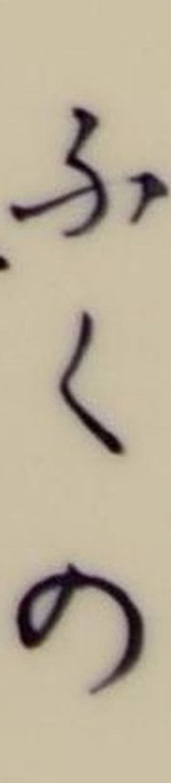ふくの
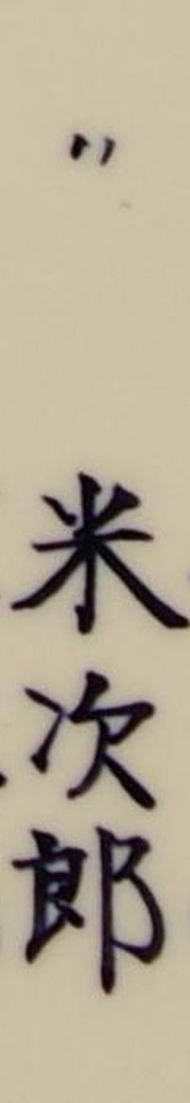米次郎
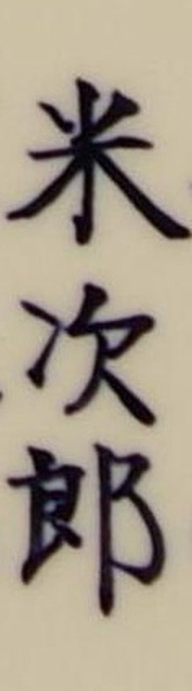米次郎
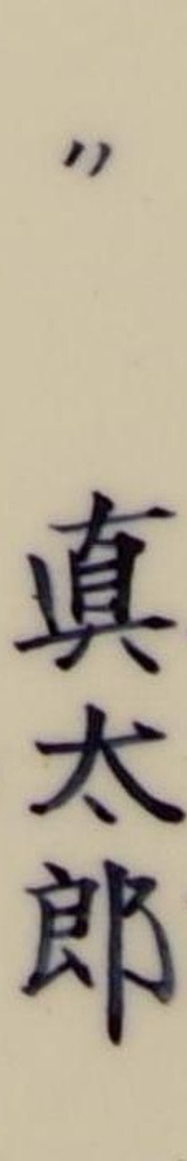真太郎
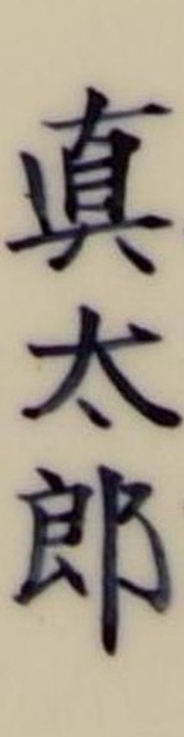真太郎
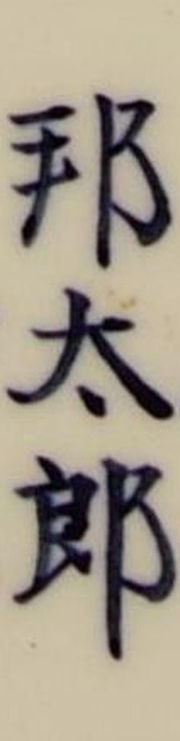邦太郎
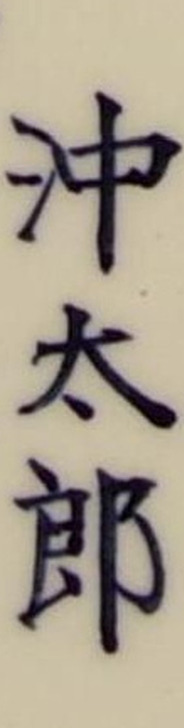沖太郎
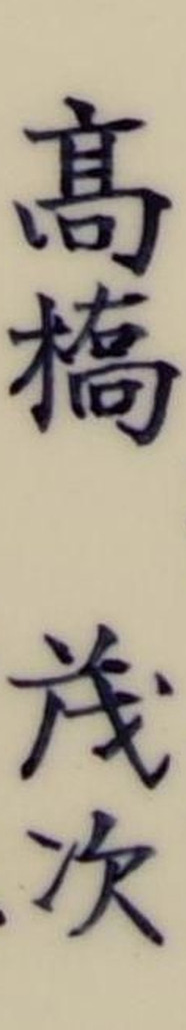高橋茂次
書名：E~L
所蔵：高野山金剛峯寺
